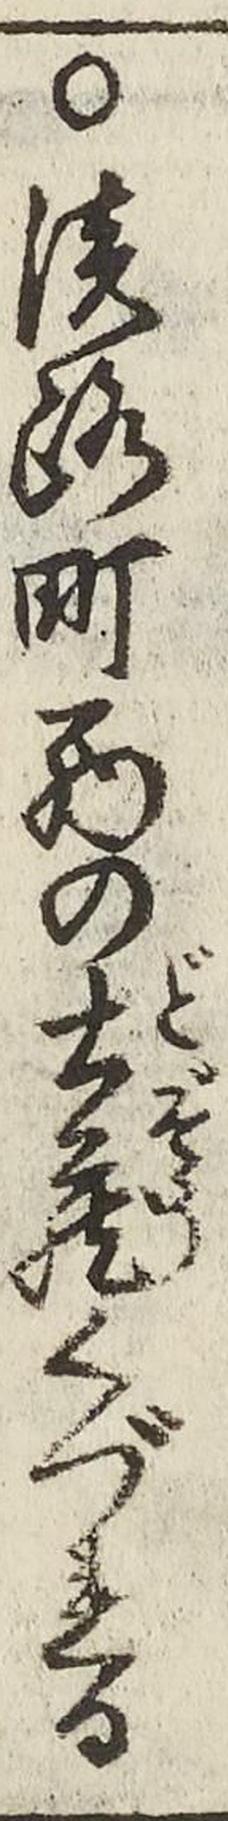〇淡路町西の土蔵くづれる
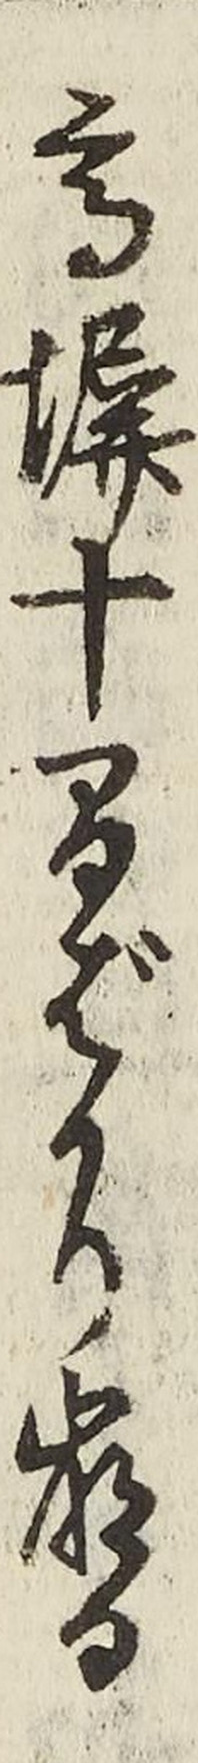高塀十間ばかり崩る
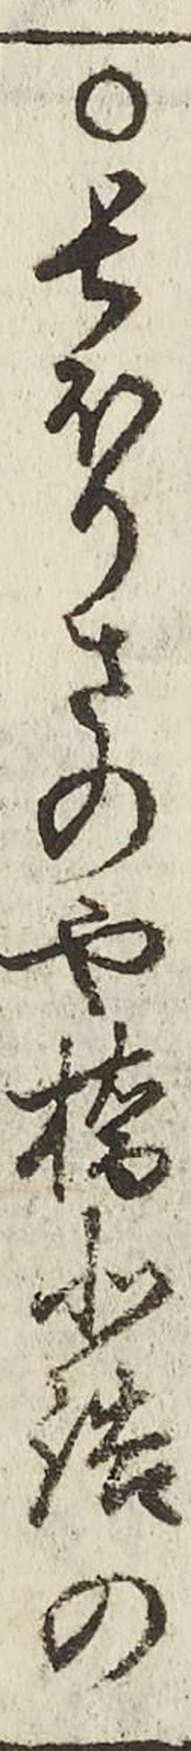〇長ほりさのや橋北詰の
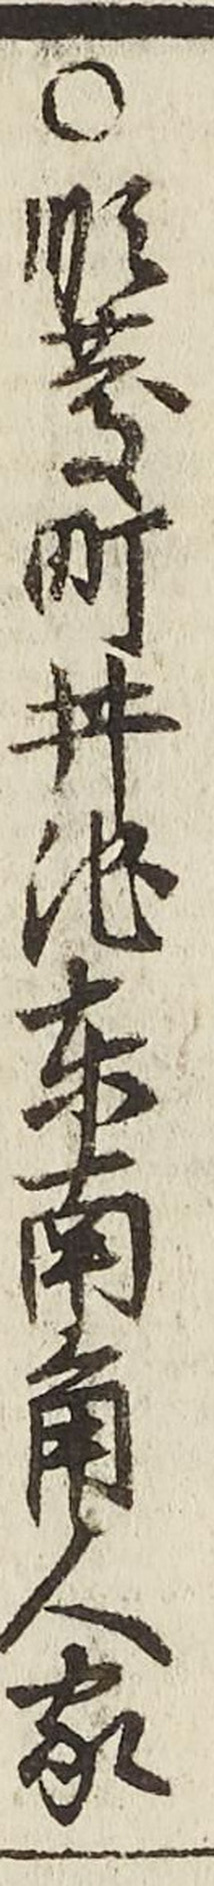〇順慶町丼池東南角人家
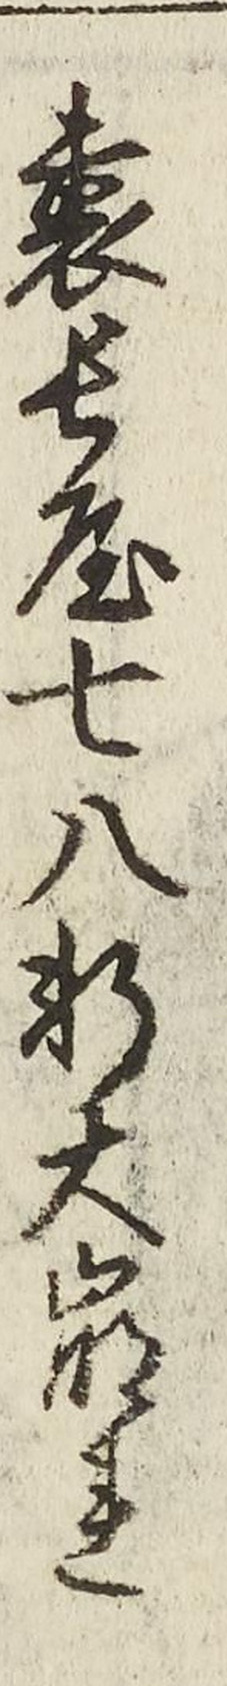裏長屋七八軒大崩れ
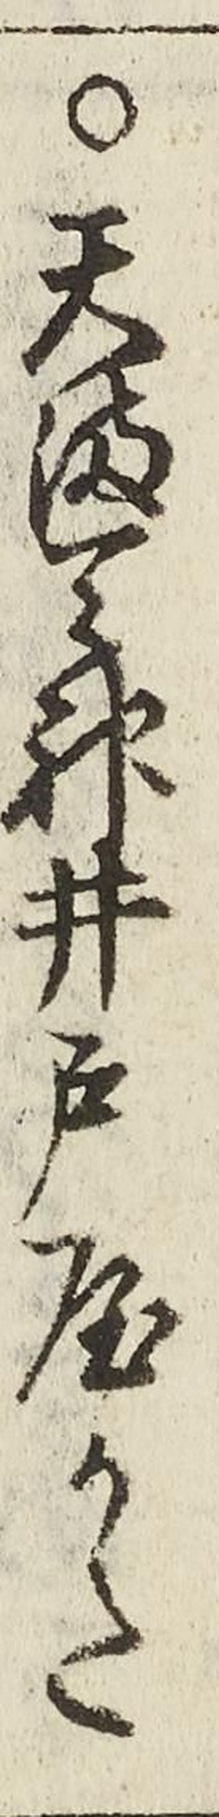〇天満天神井戸屋かた
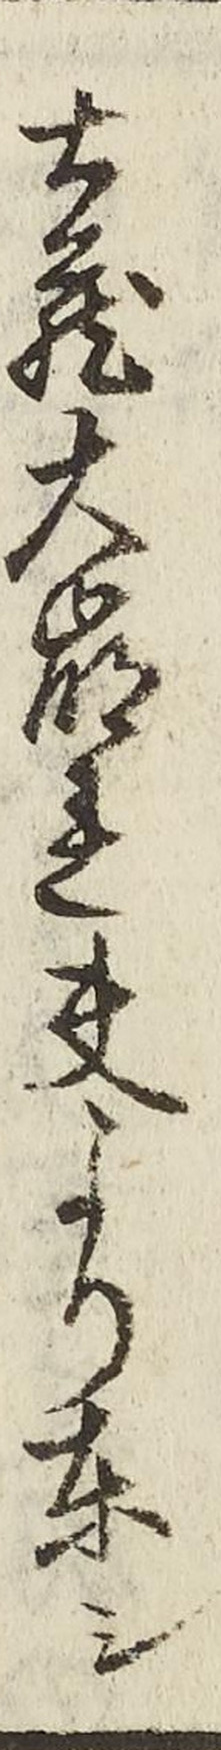土蔵大崩れ夫より東し
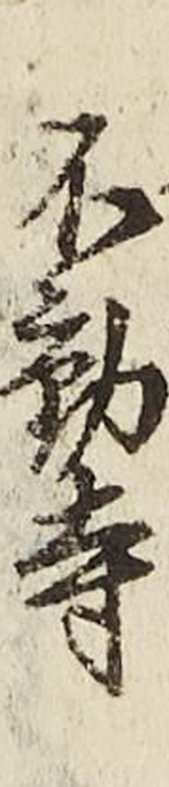不動寺
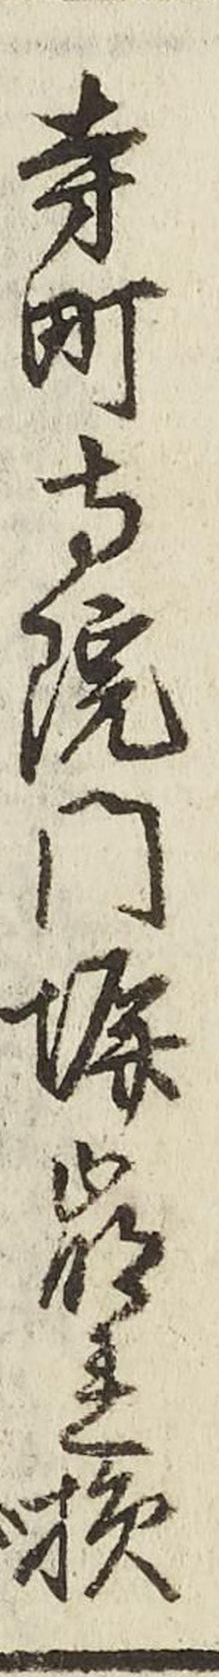寺町寺院門塀崩れ損じ
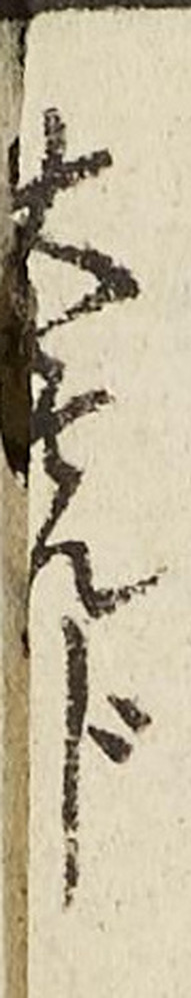大そんじ
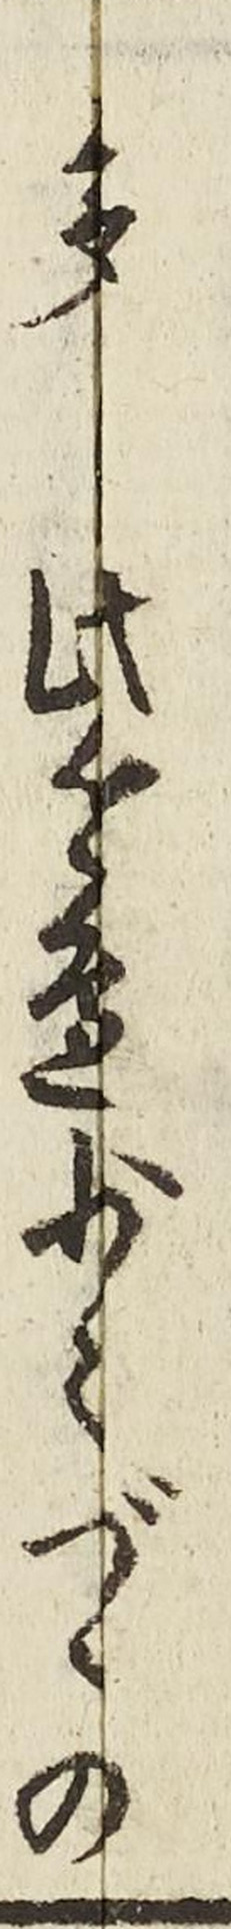多し此近辺少々づゝの
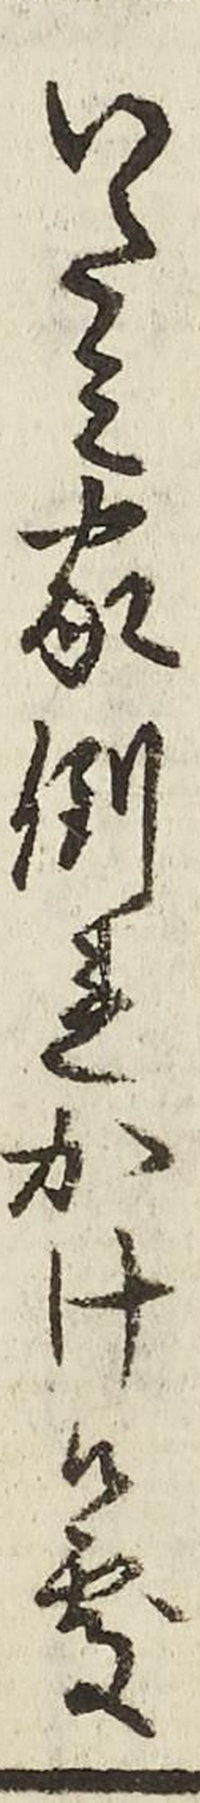いたみ家倒れかけ候処
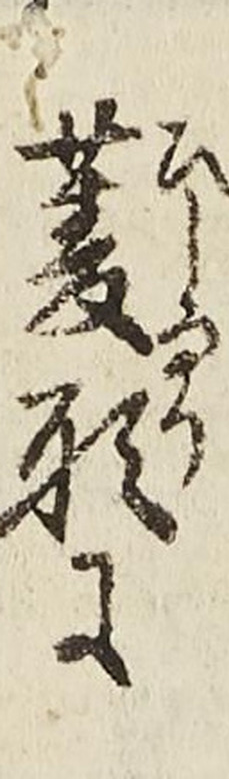菱形に
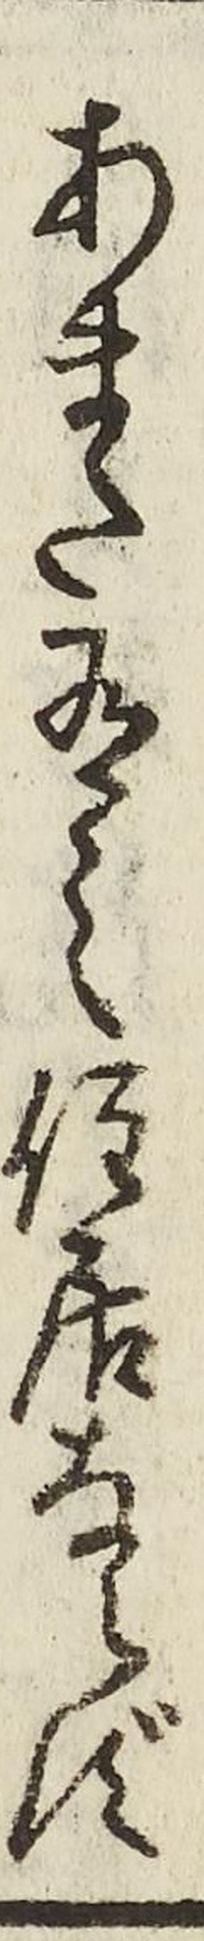あまた有之住居ならず
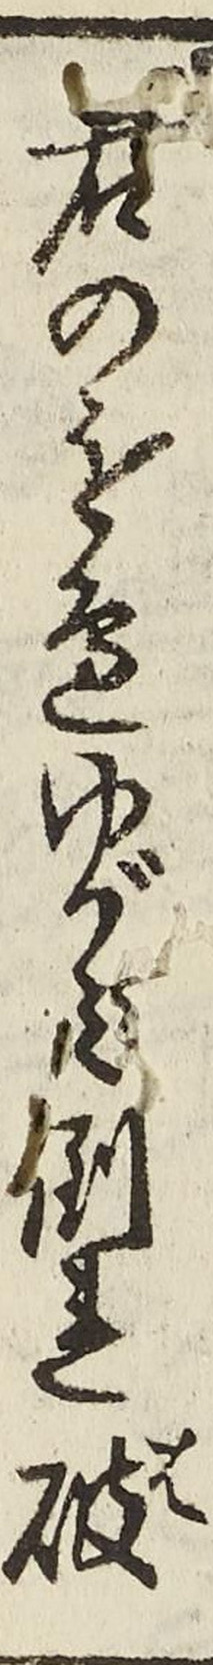右の近辺ゆがみ倒れ破
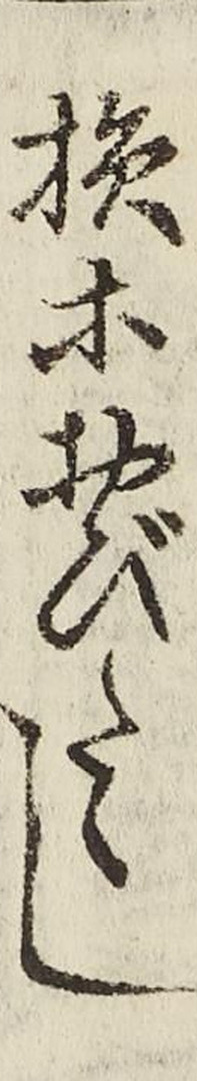損等おびたゝし
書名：地震津浪末代噺の種　全
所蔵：東京大学地震研究所図書室 Earthquake Research Institute Library, The University of Tokyo, JAPAN
